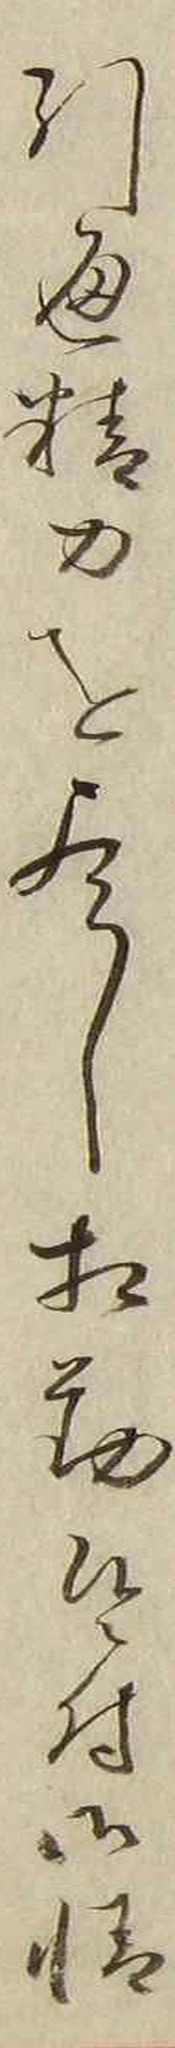引通精力を尽し相勤候ニ付御情

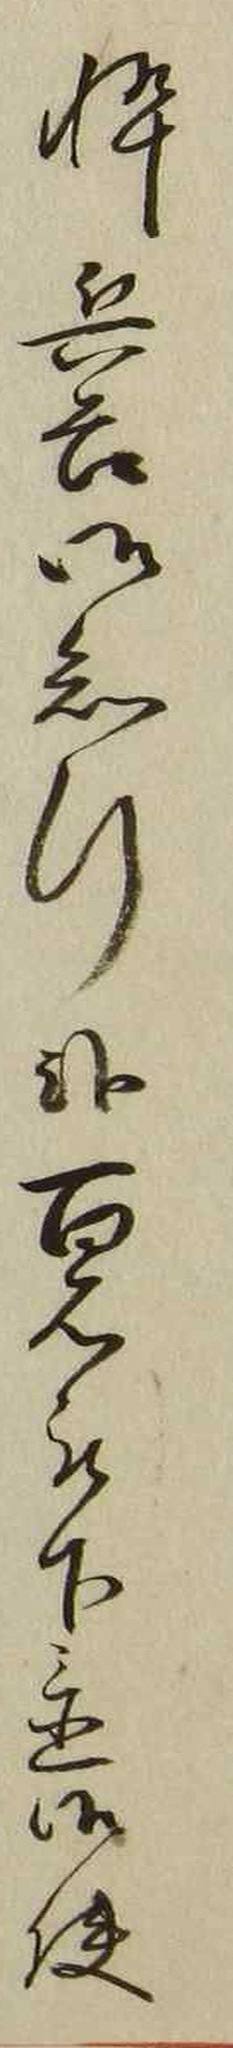忰兵吉御知行弐百石被下置御使
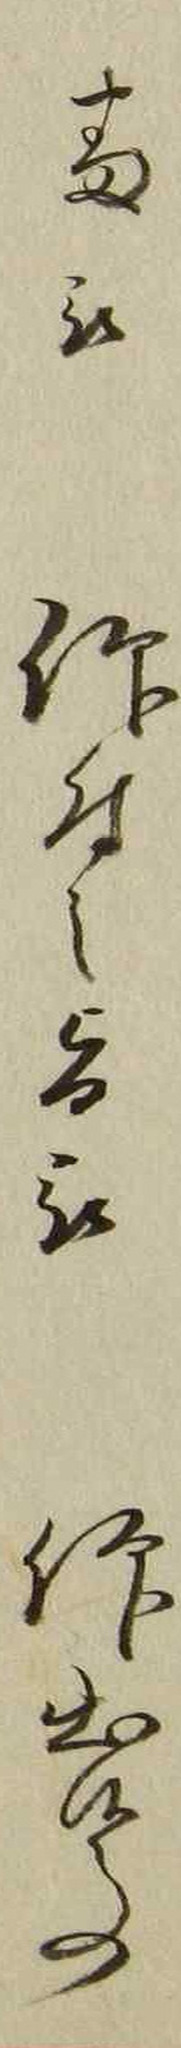番被仰付之旨被仰出候事
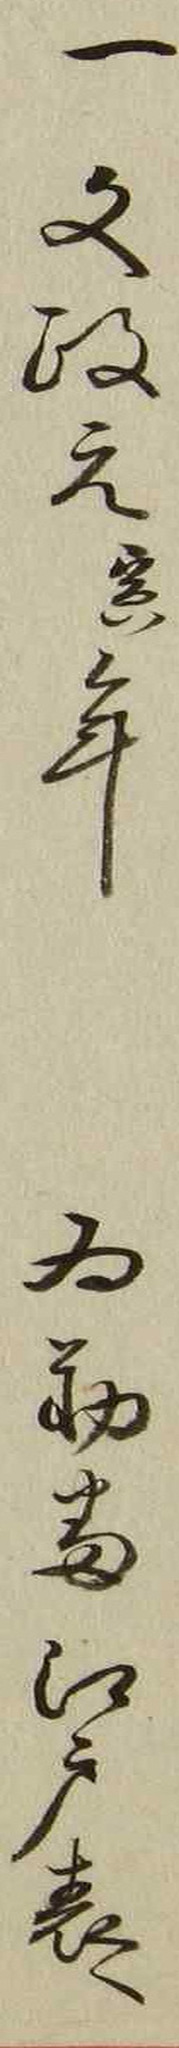一文政元寅年為勤番江戸表へ
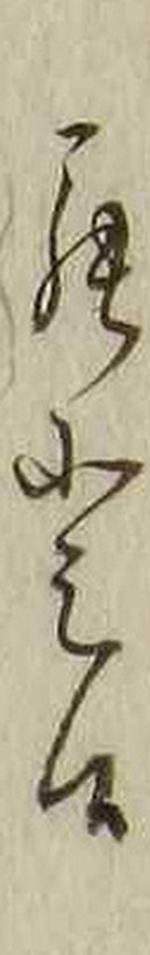罷登候
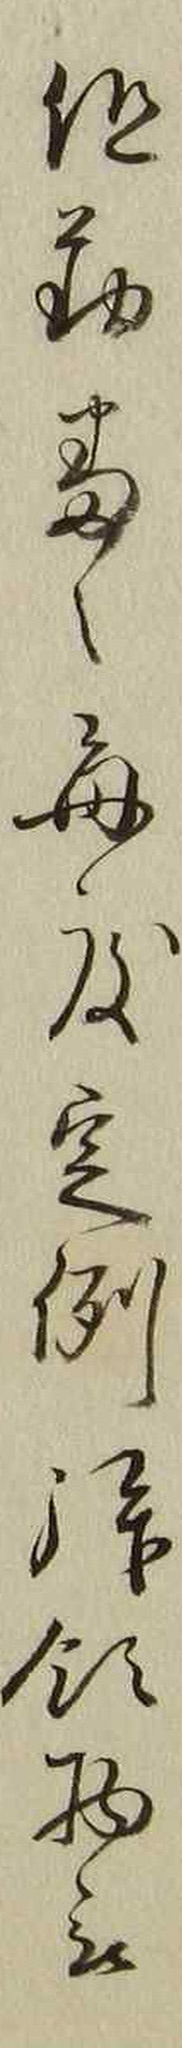但勤番之毎度定例拝領物被
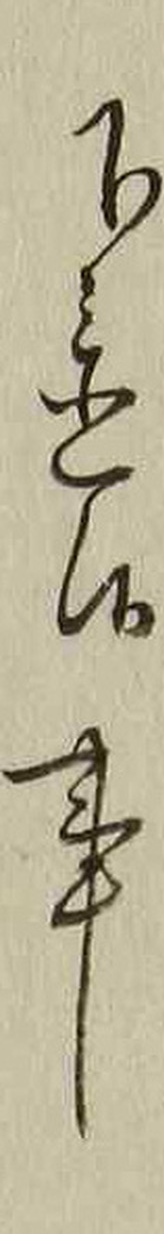下置候事
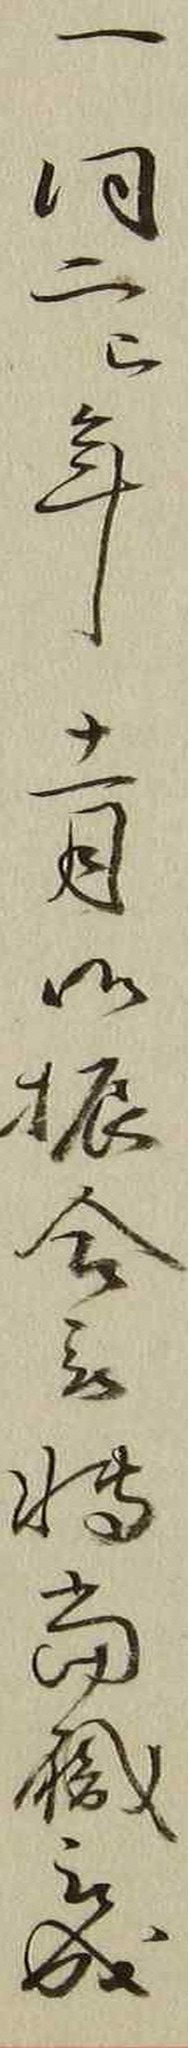一同二巳年十一月御振合被転当職被成
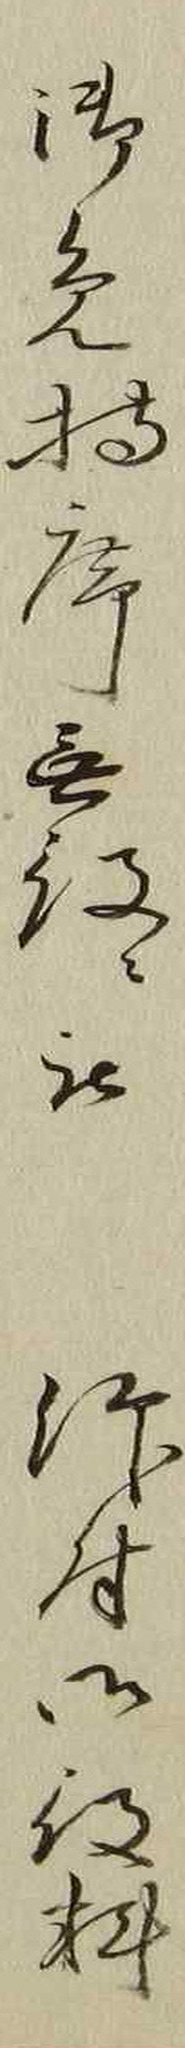御免持席無役ニ被仰付御役料
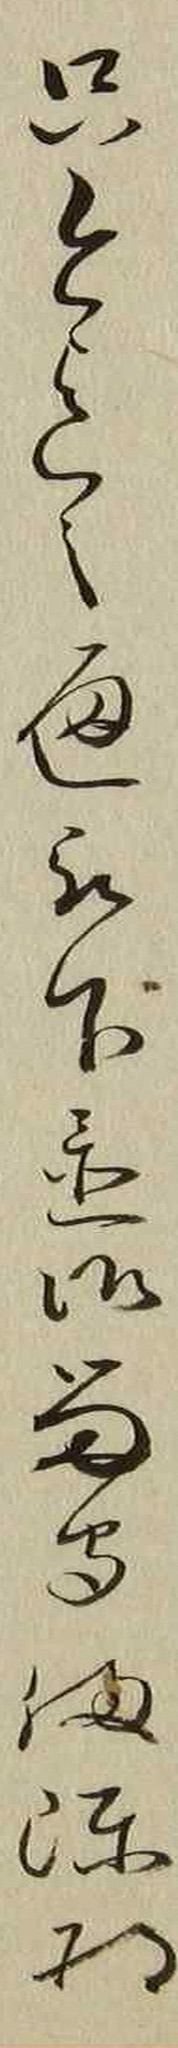只今迄之通被下置御留守備陣持
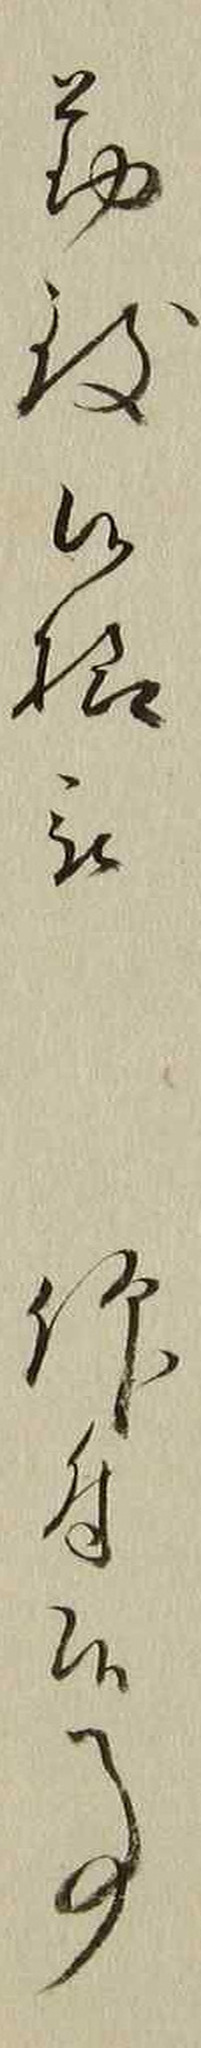勤致候様被仰付候事
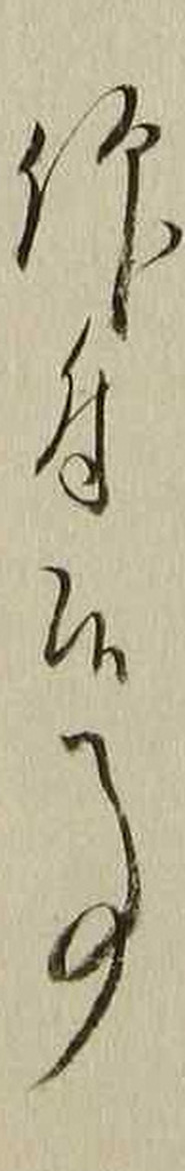仰出候事
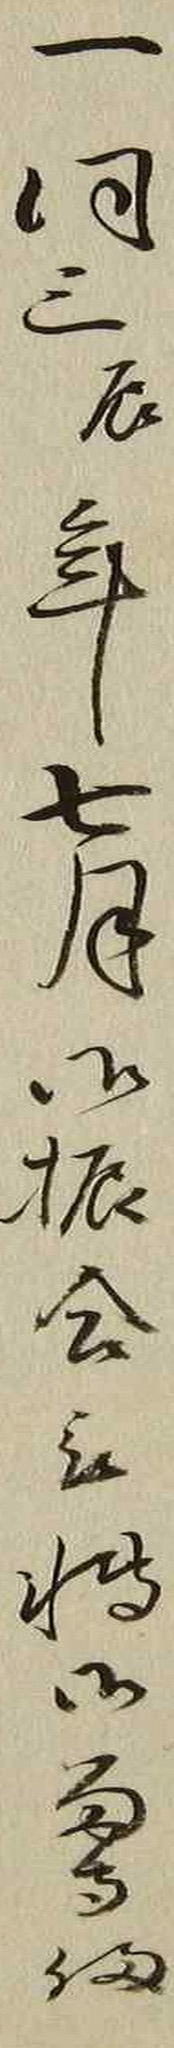一同三辰年七月御振合被転御留守備
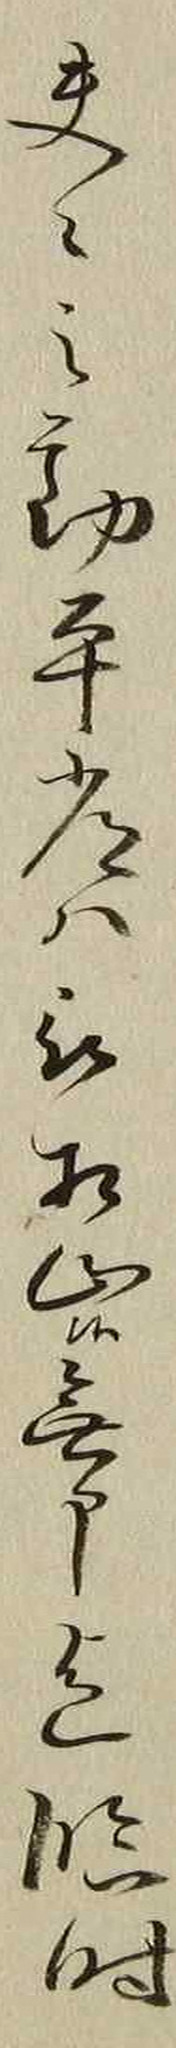夫々之勤平常ハ被相止候無申迄臨時
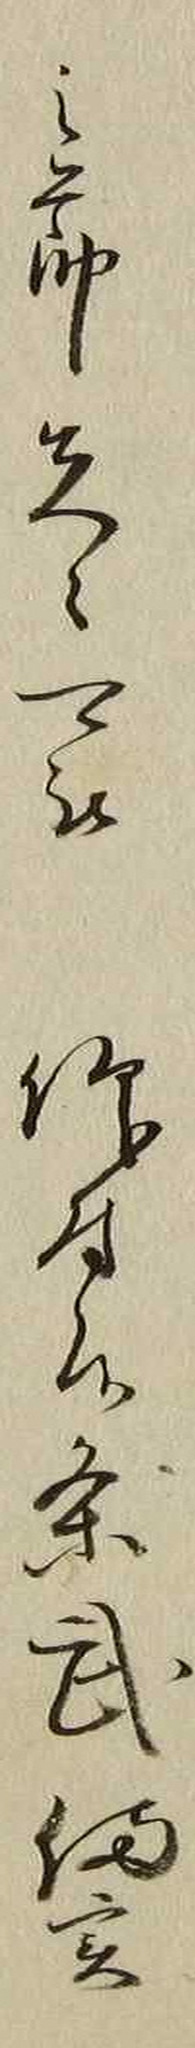之節先々可被仰付候条武備実
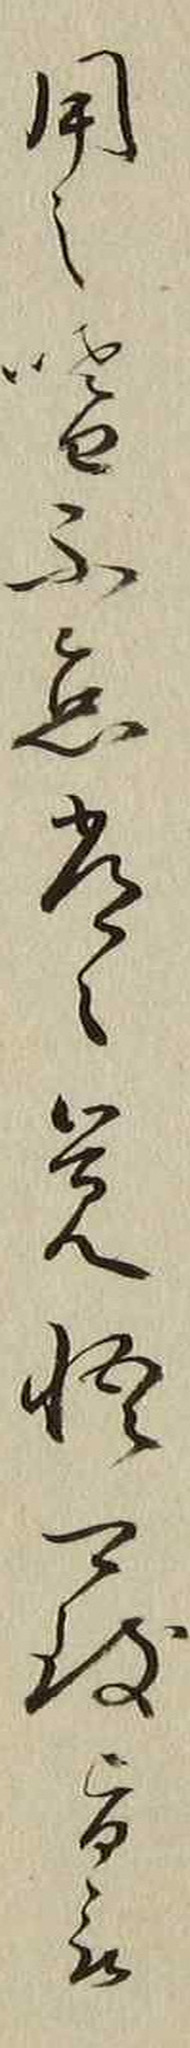用之嗜不怠常之覚悟可致旨被
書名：諸士系譜　巻之2　い之部2
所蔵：会津若松市立会津図書館
